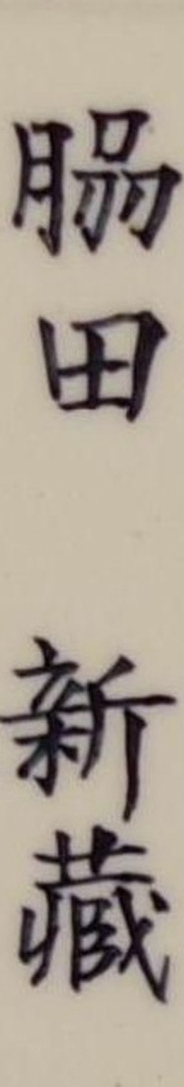脇田新蔵
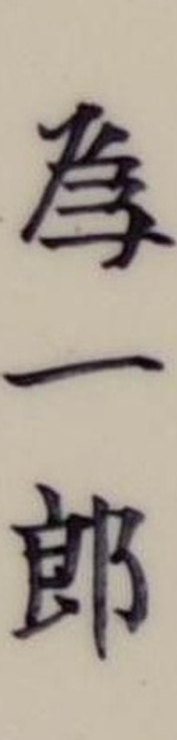為一郎
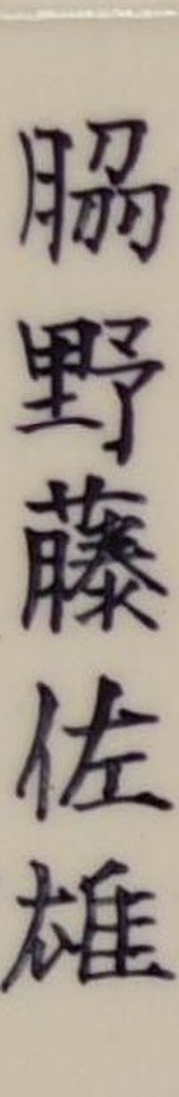脇野藤佐雄

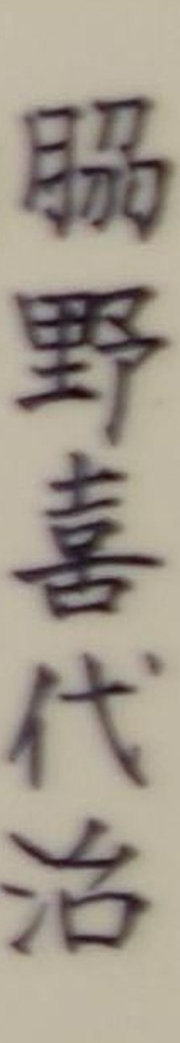脇野喜代治
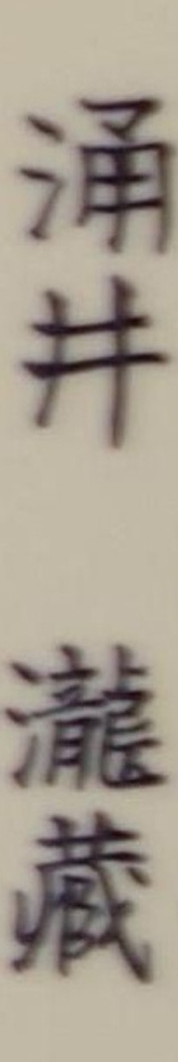涌井瀧蔵
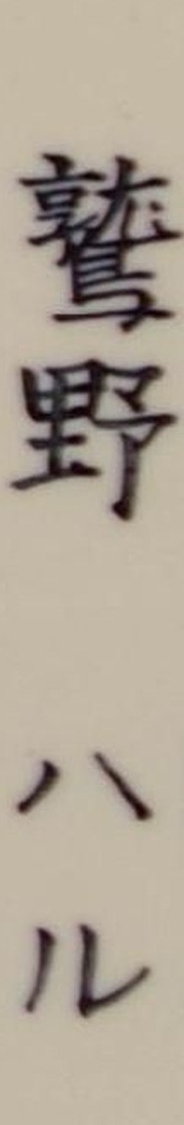鷲野ハル
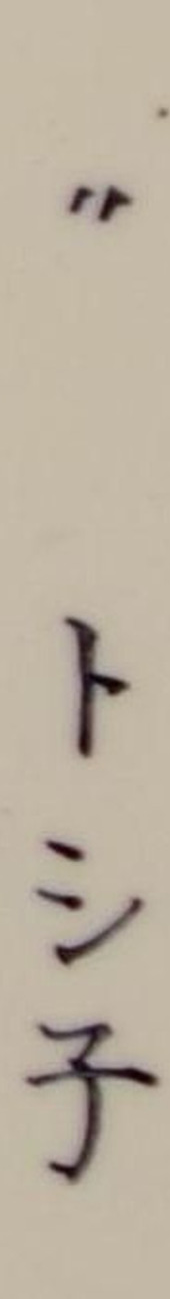トシ子
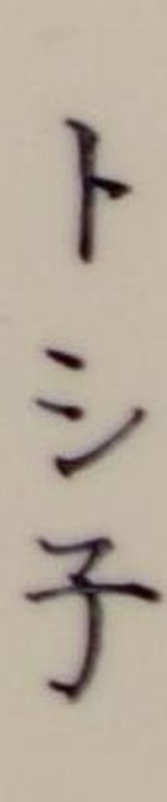トシ子
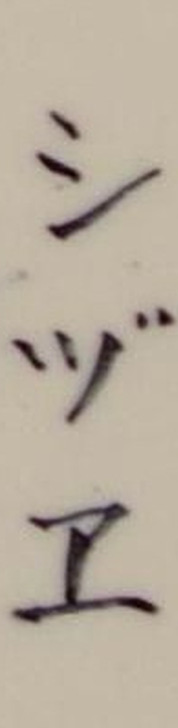シヅエ
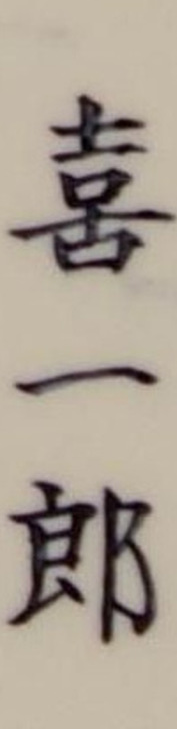喜一郎
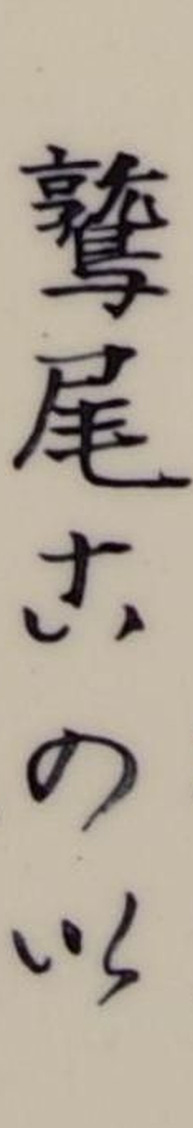鷲尾このい

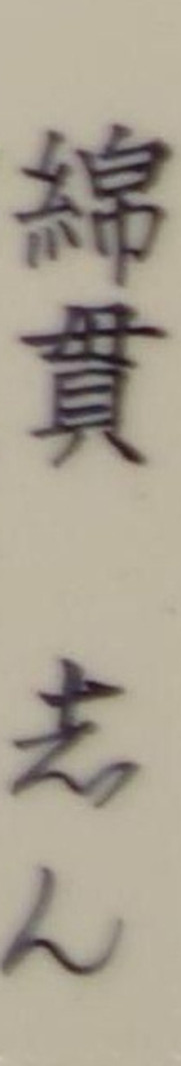綿貫しん
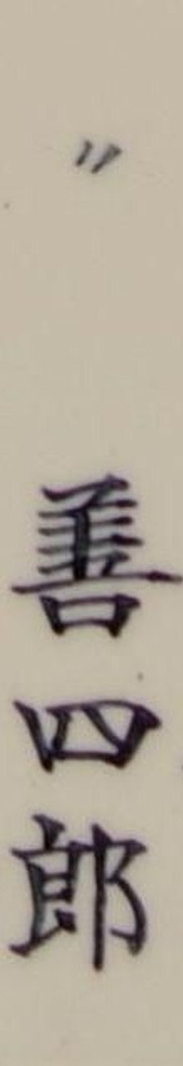善四郎
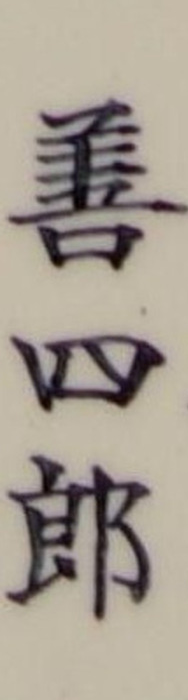善四郎
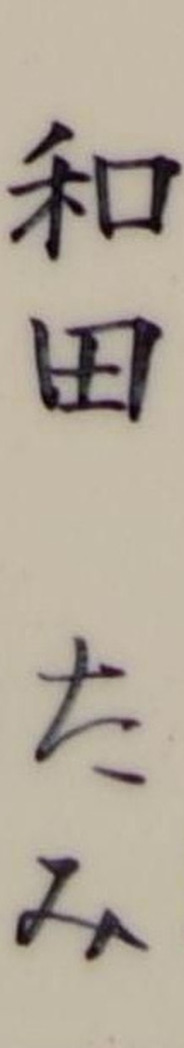和田たみ
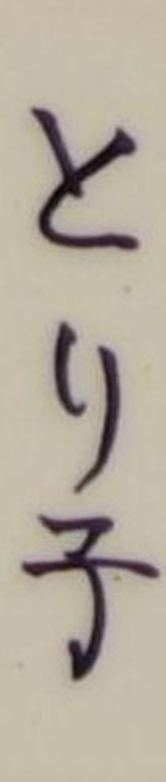とり子
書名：M~S
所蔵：高野山金剛峯寺
